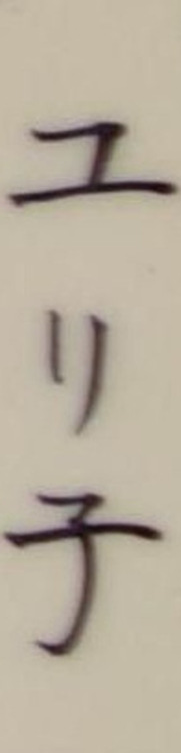ユリ子
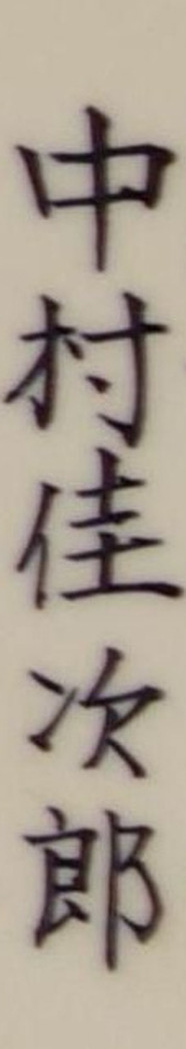中村佳次郎
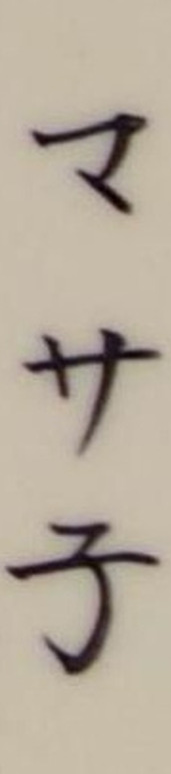マサ子
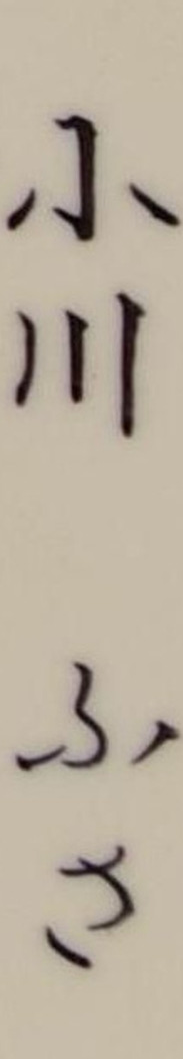小川ふさ
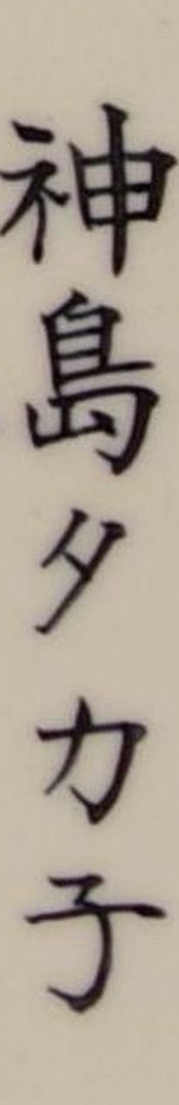神島夕カ子
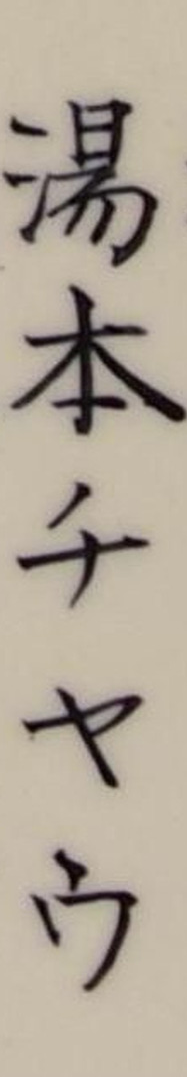湯本チヤウ
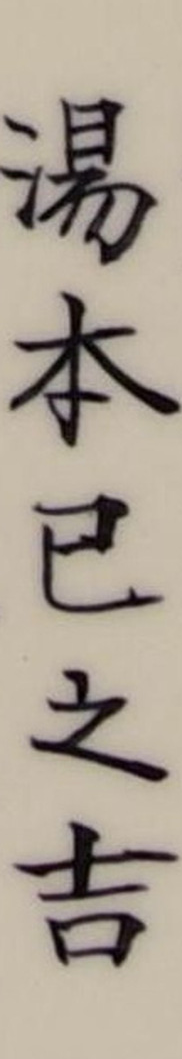湯本巳之吉
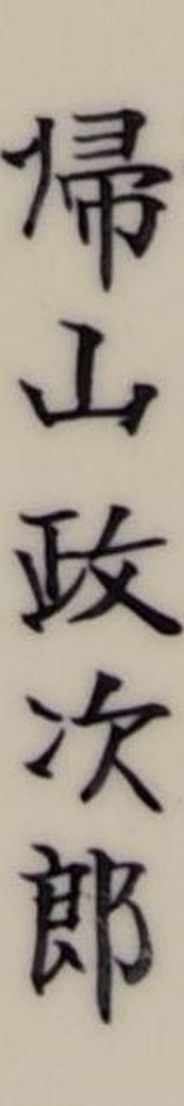帰山政次郎
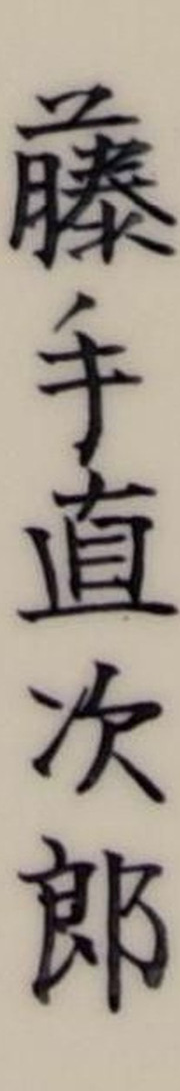藤手直次郎
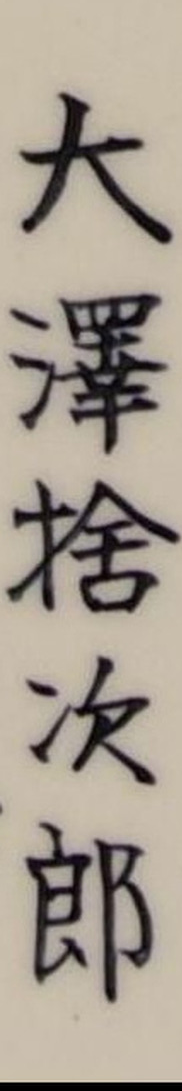大澤捨次郎
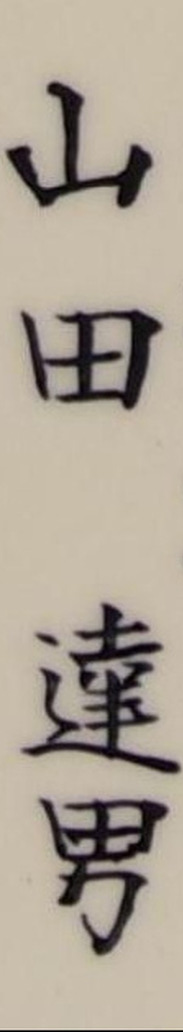山田達男
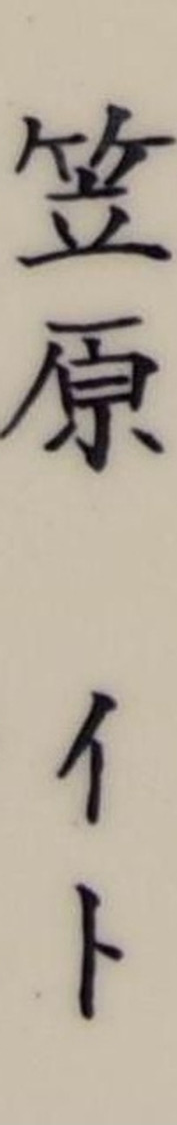笠原イト
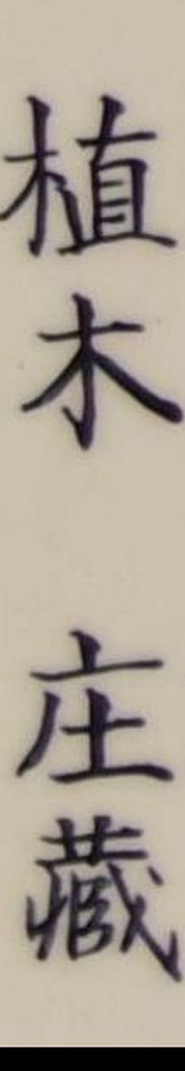植木庄蔵
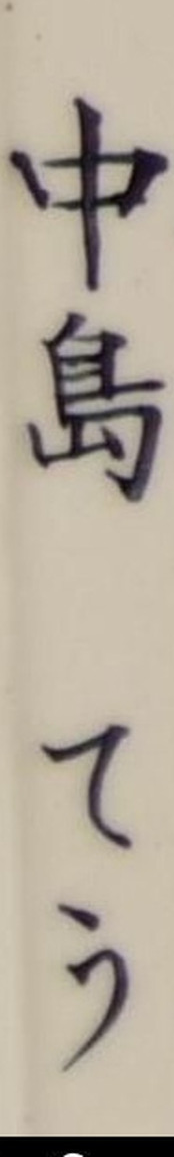中島てう

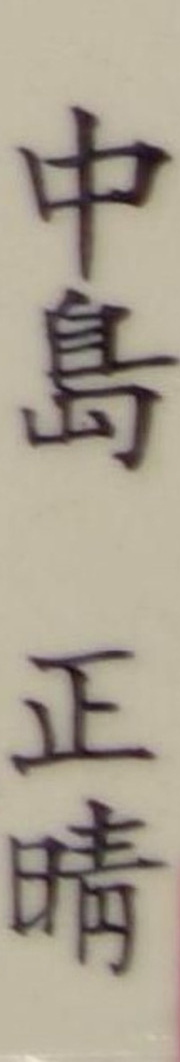中島正晴
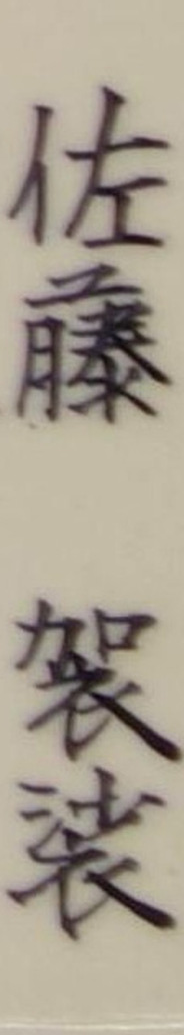佐藤袈裟
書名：E~L
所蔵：高野山金剛峯寺
